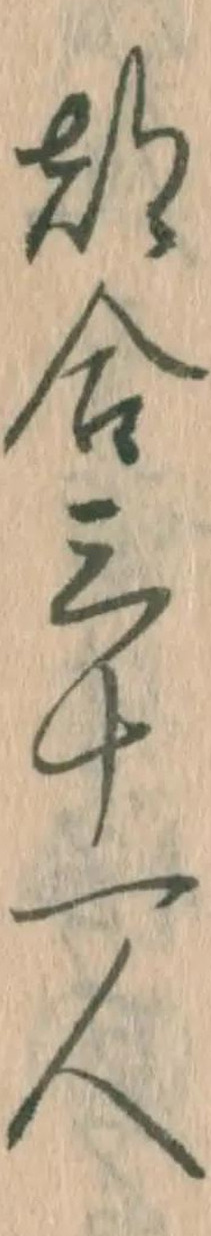都合三十一人
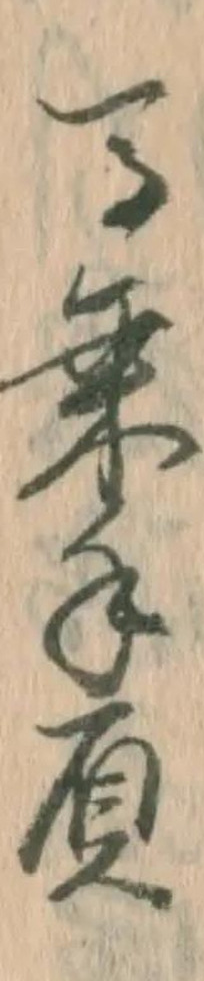馬乗手負
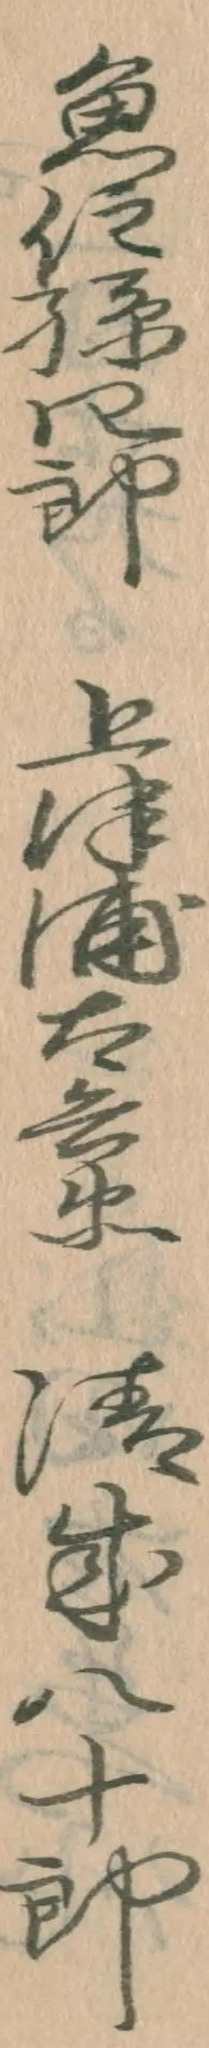魚住孫四郎上津浦太兵衛清成八十郎
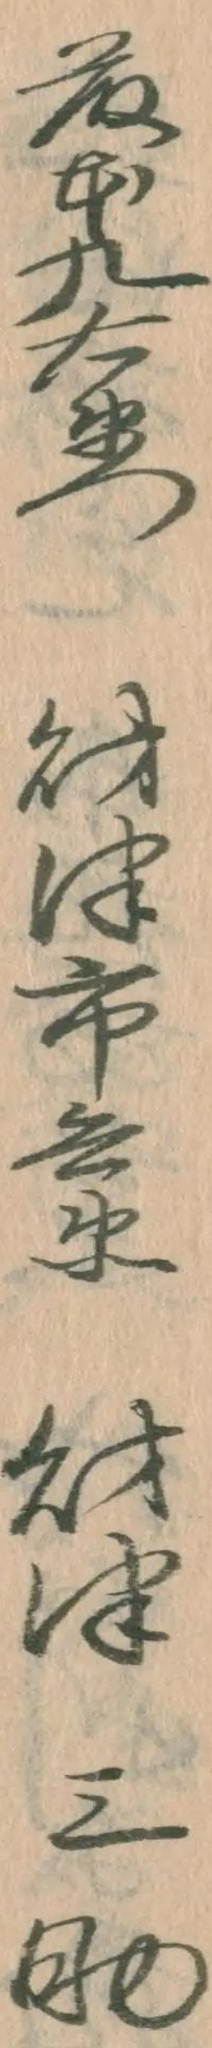藤本九右衛門財津市兵衛財津三助
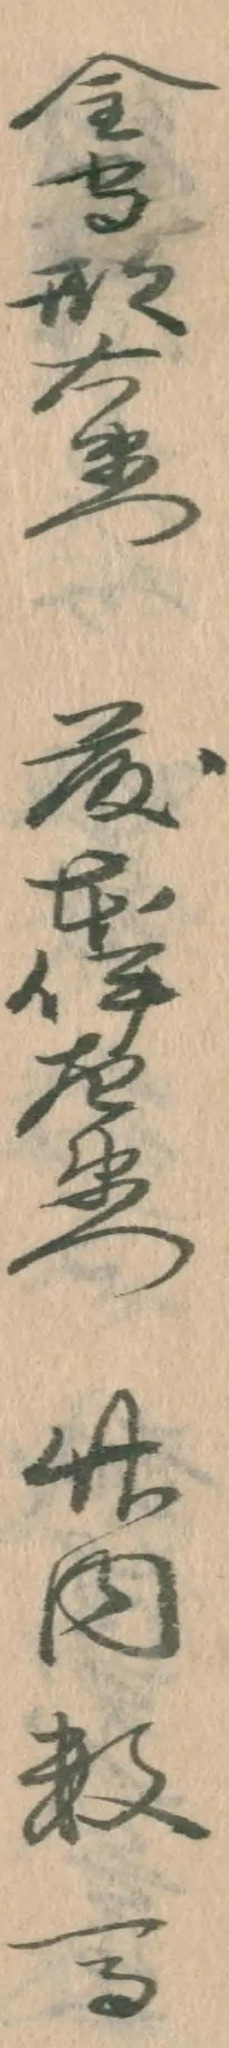金守形右衛門藤本伊左衛門竹内数馬
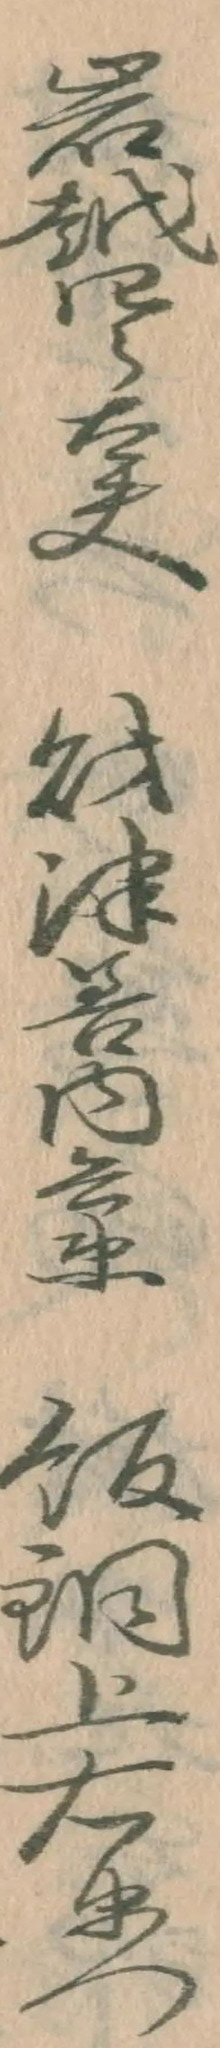岩越四郎太夫財津善内兵衛飯銅上右衛門
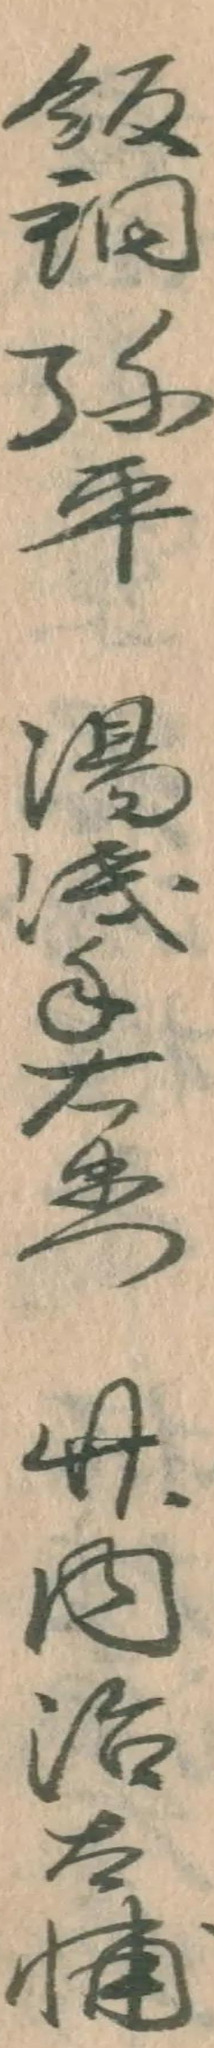飯銅弥平湯浅手右衛門竹内治太輔
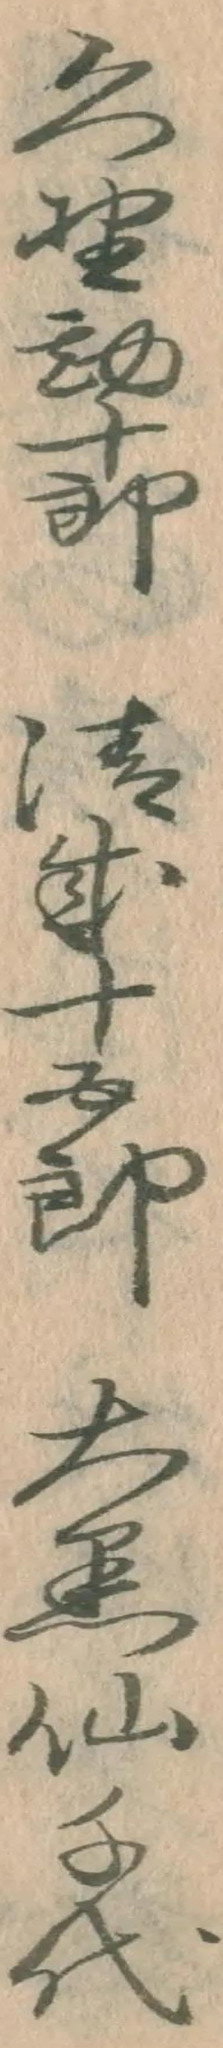久野勘十郎清成十五郎大黒仙千代
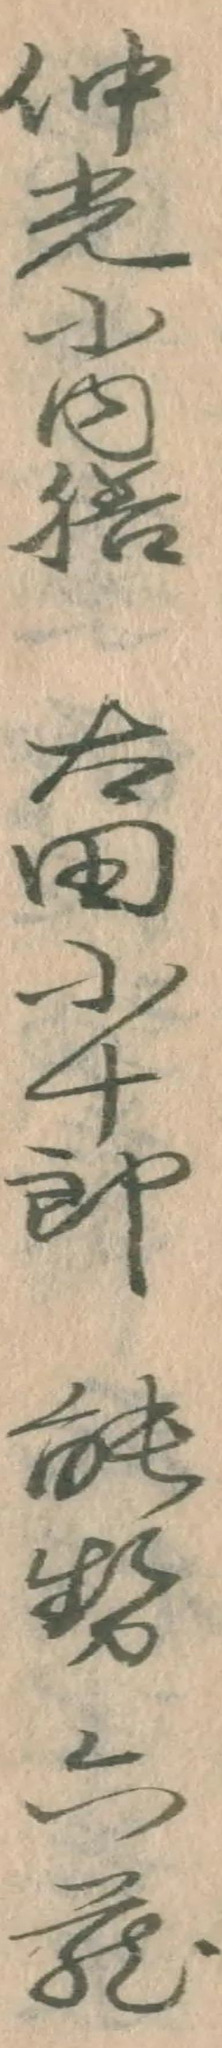仲光小内膳太田小十郎能勢六蔵
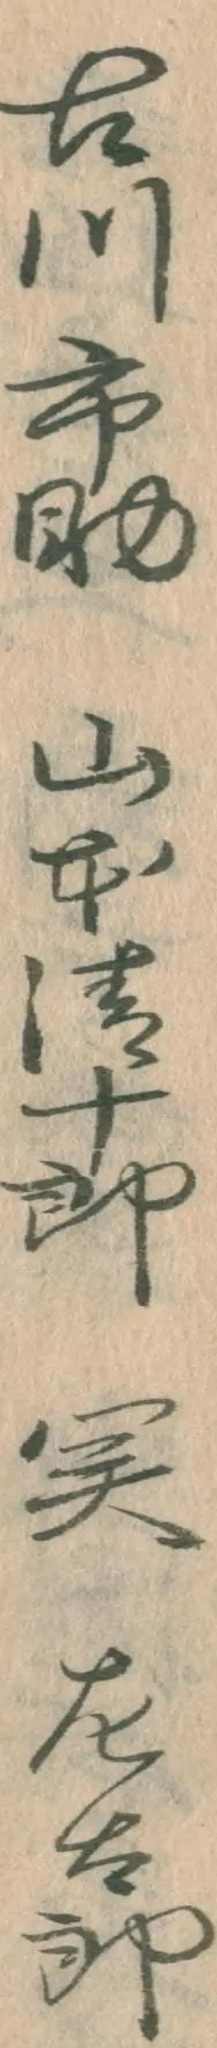古川市助山本清十郎関左太郎
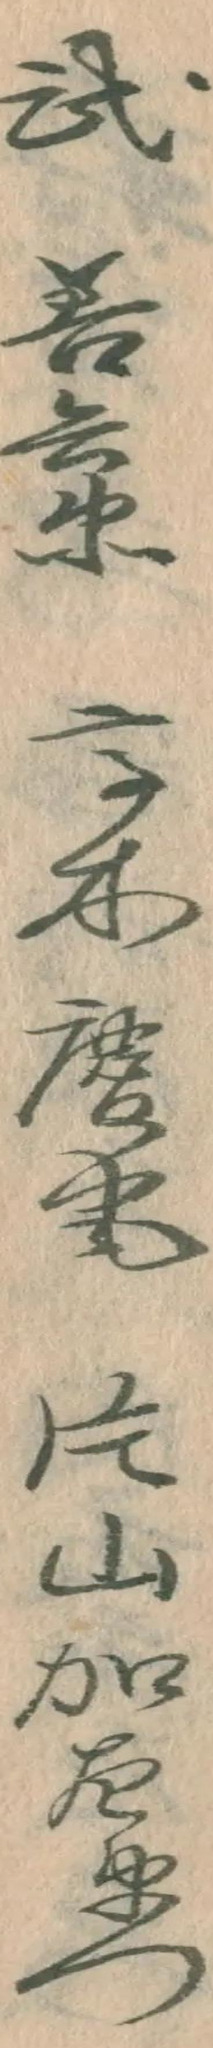武善兵衛高木慶宅片山加左衛門
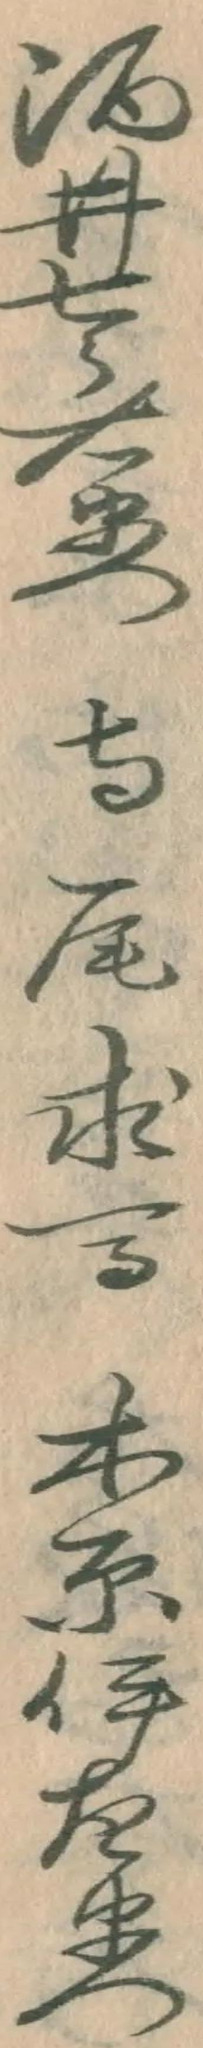酒井七郎右衛門寺尾求馬木原伊左衛門
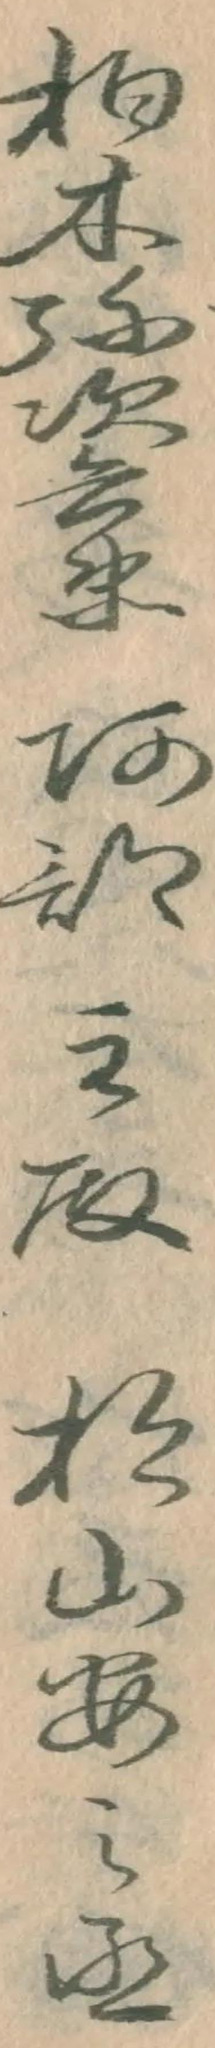柏木弥次兵衛阿部主殿杉山安之丞

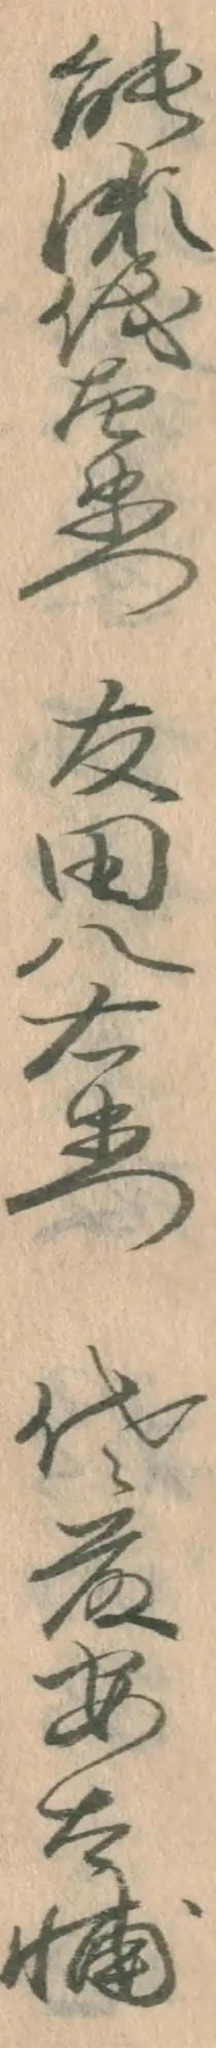能瀬儀左衛門友田八右衛門佐藤安太輔
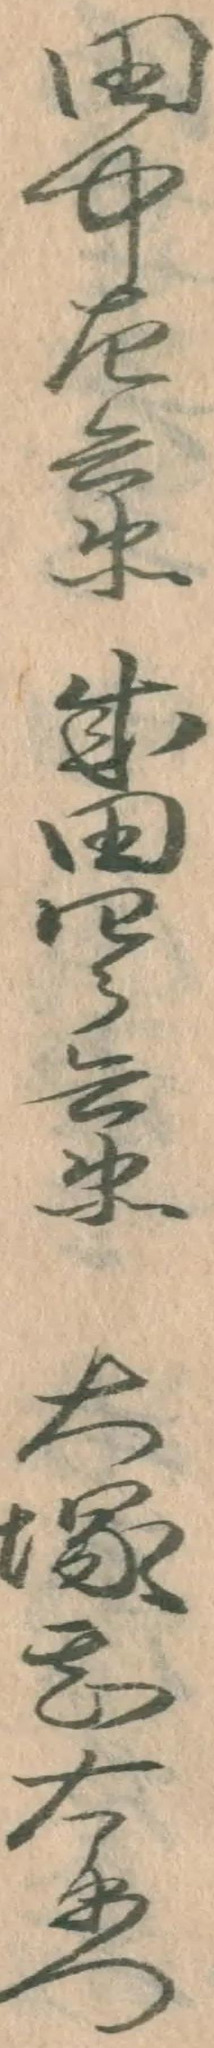田中左兵衛成田四郎兵衛大塚甚右衛門
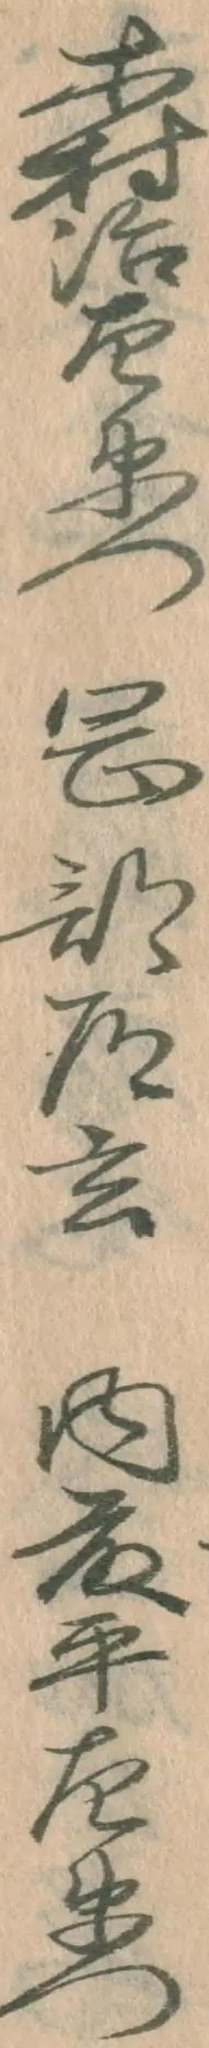森治左衛門岡部道玄内藤平左衛門
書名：切支丹御退治記 49巻. [9]
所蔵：国立国会図書館 National Diet Library, JAPAN
